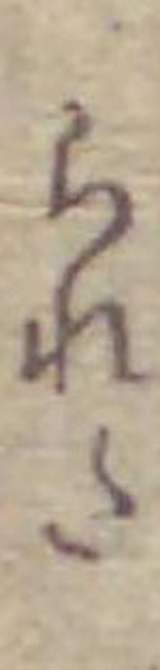られた
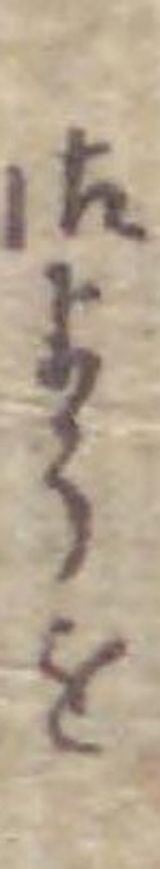御ようを
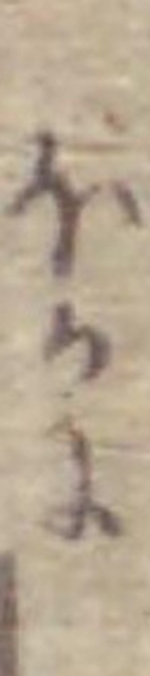ほかに
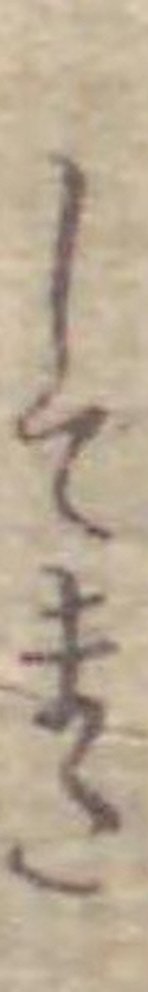してまた
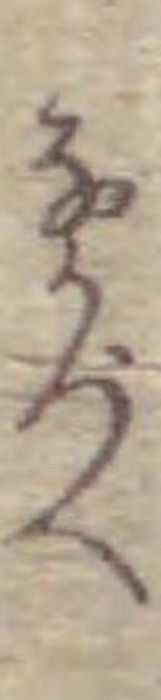なかつへ

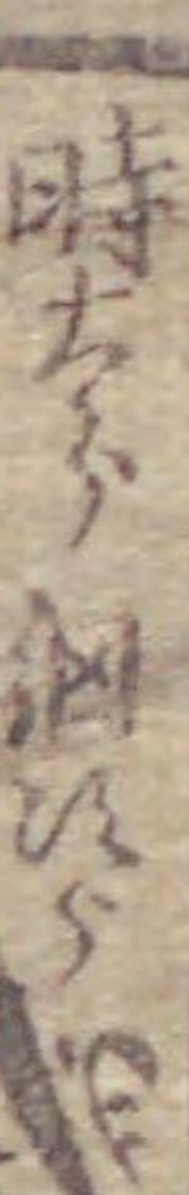時太郎綱次郎
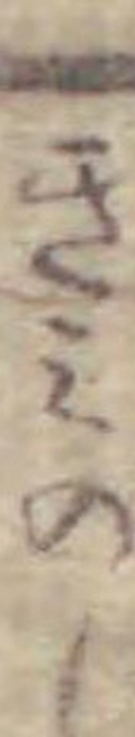きみの
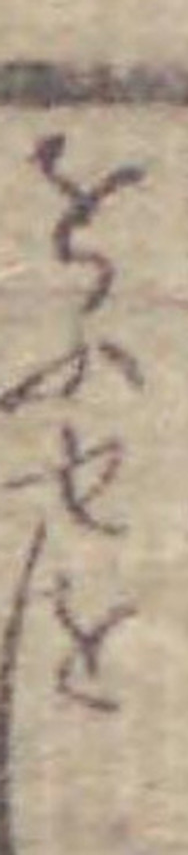をふせを
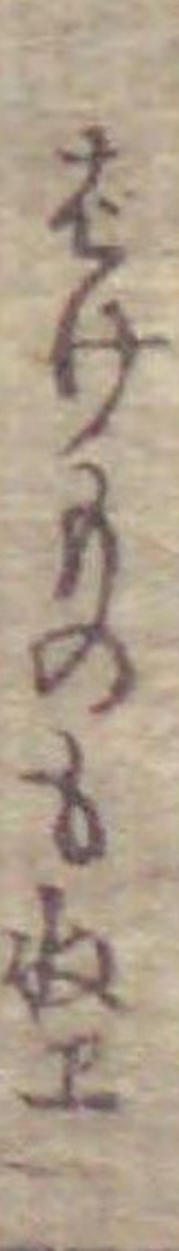ばけものもねェ
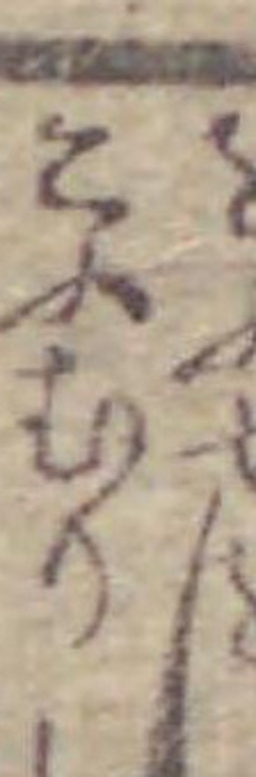こふむり
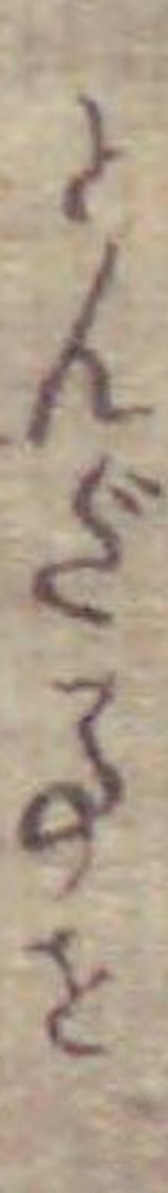とんだ事を
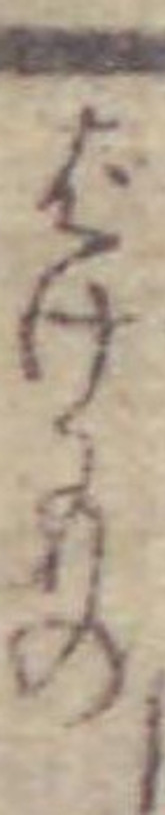ばけもの
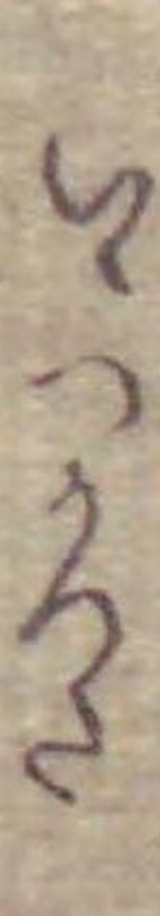いゝつかつた
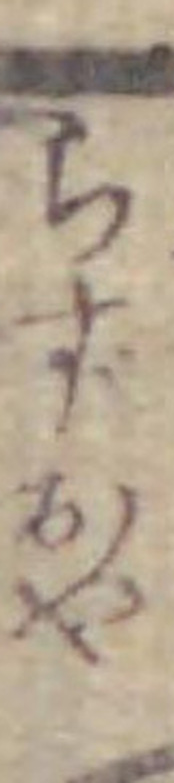らずおや
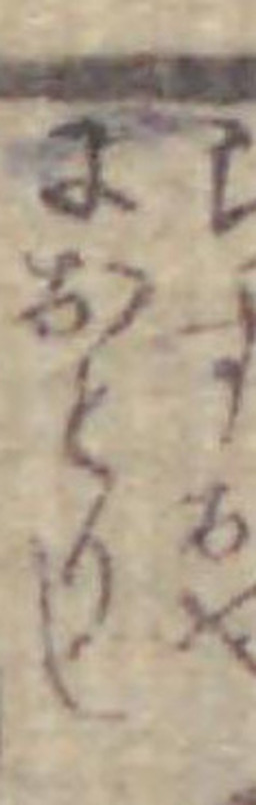におとりし
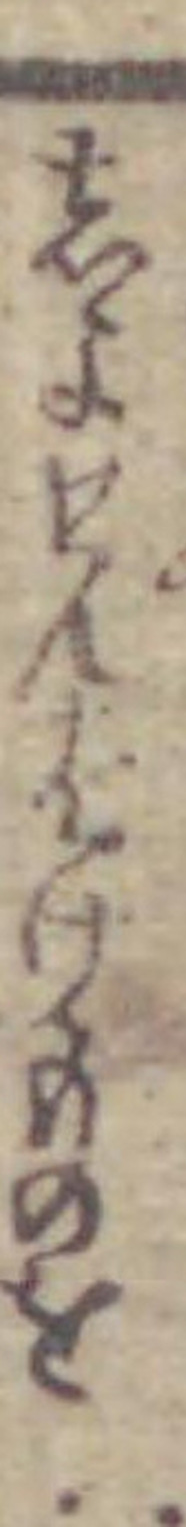しよせんばけものを
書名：二日替 : 2巻
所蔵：国立国会図書館 National Diet Library, JAPAN
